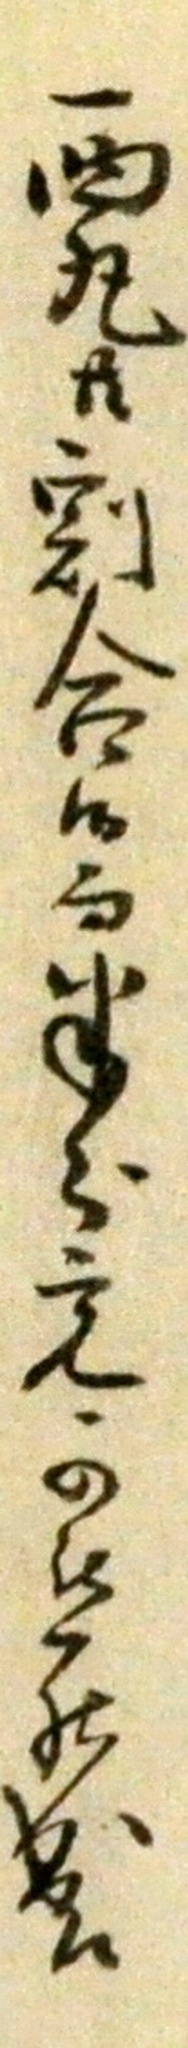西丸共割合候而半分充可被罷出候
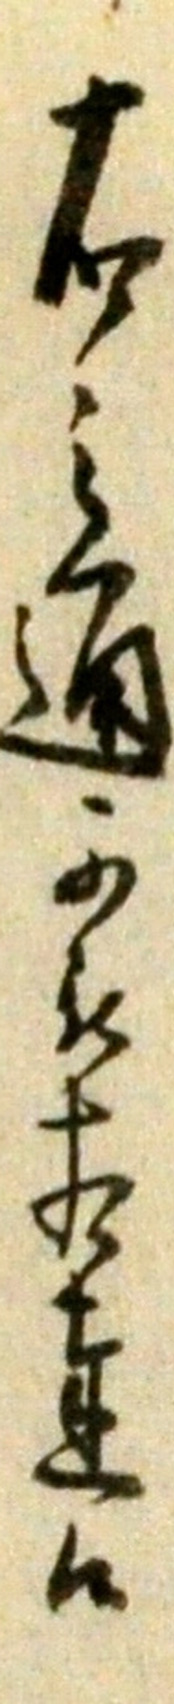右之通可被相達候
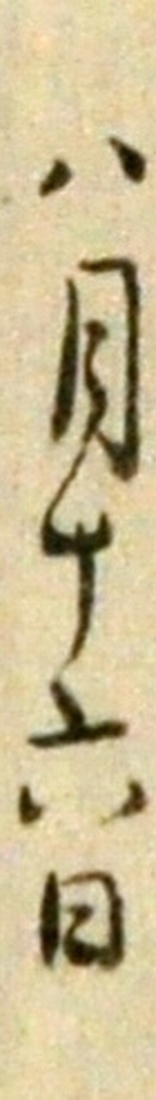八月十六日
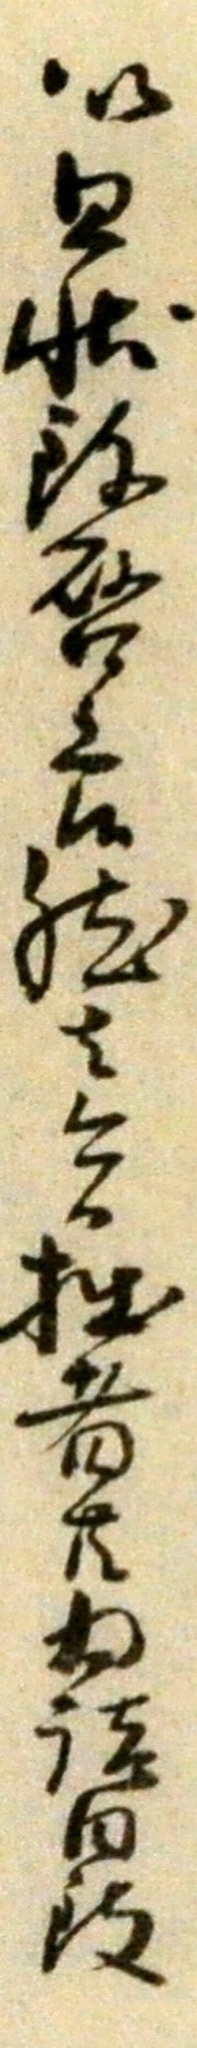以廻状致啓上候然は今日拙者共為詰日致
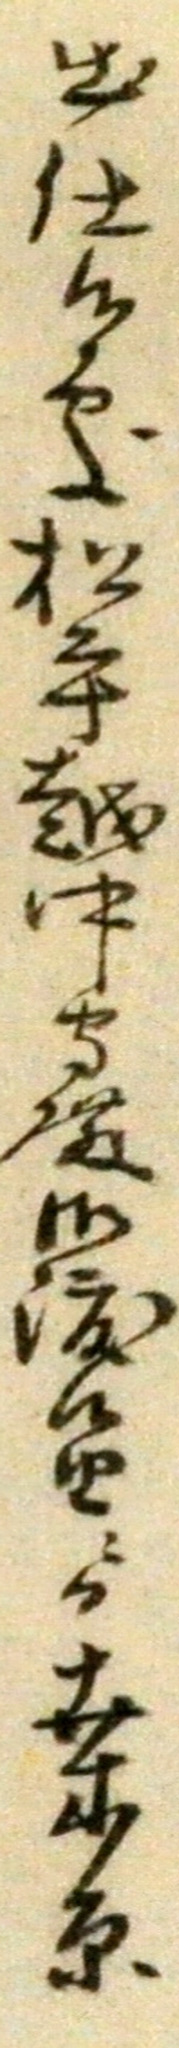出仕候處松平越中守殿御渡候由ニ而桑原
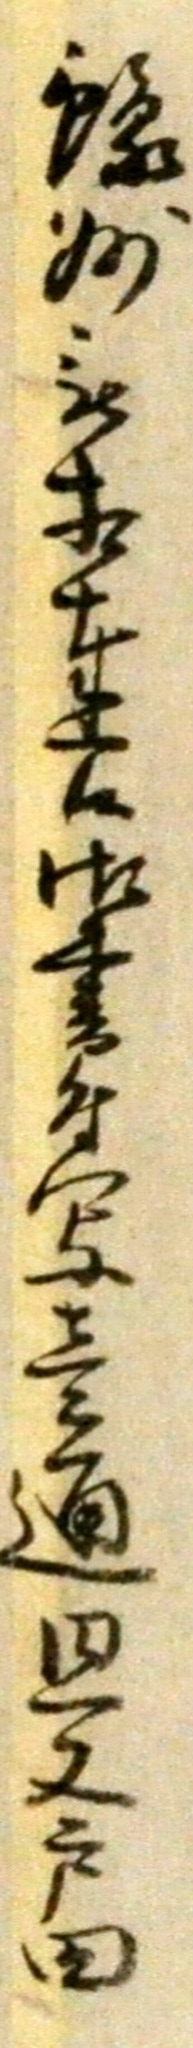豫州被相達候御書付写壱通且又戸田
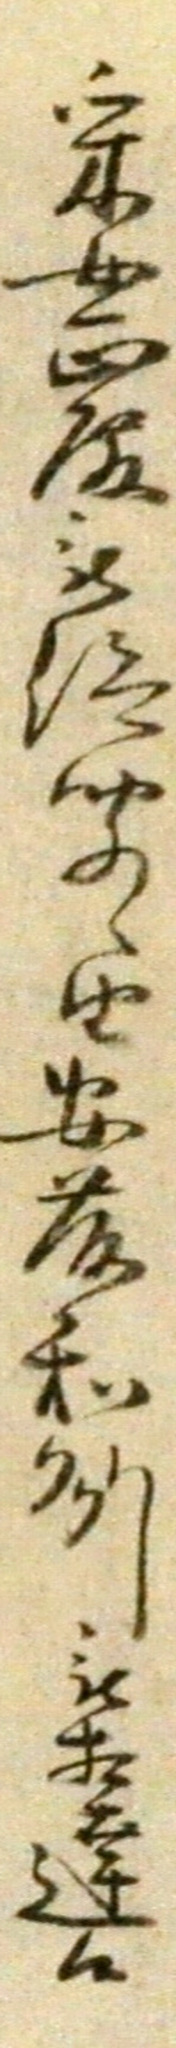采女正殿被仰聞候由安藤和州被相達候
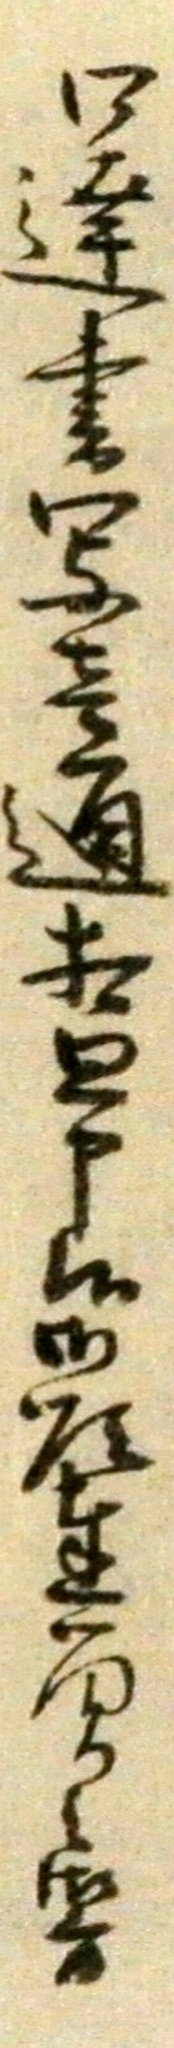口達書写壱通相廻申候御順達留り之御方
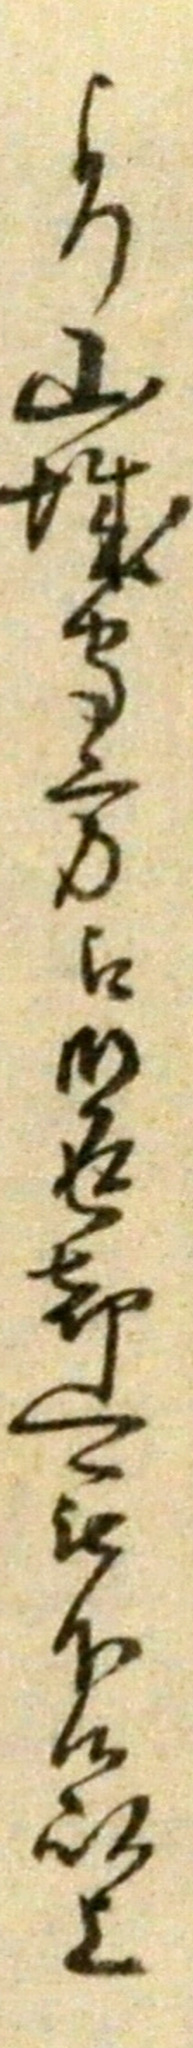より山城守方え御返却可被下候以上
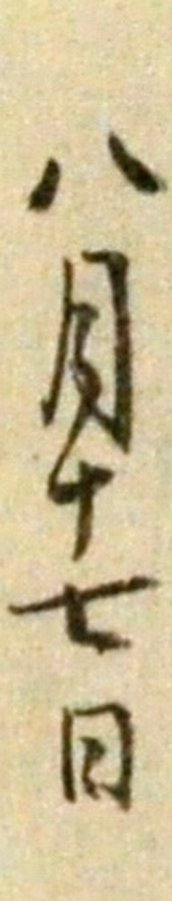八月十六日
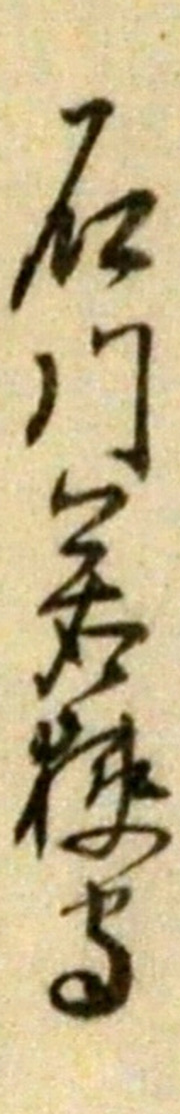石川若狭守
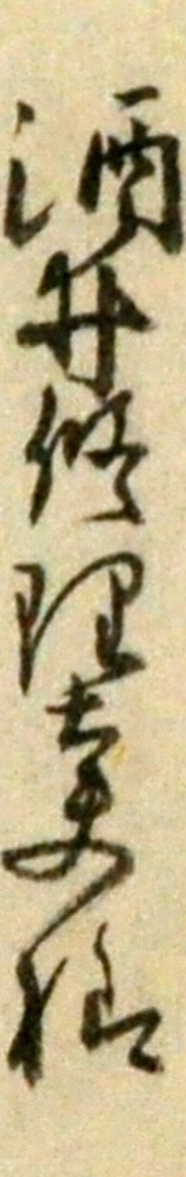酒井修理大夫様

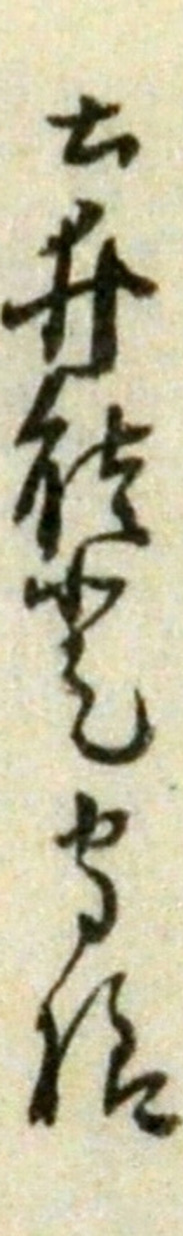土井能登守様
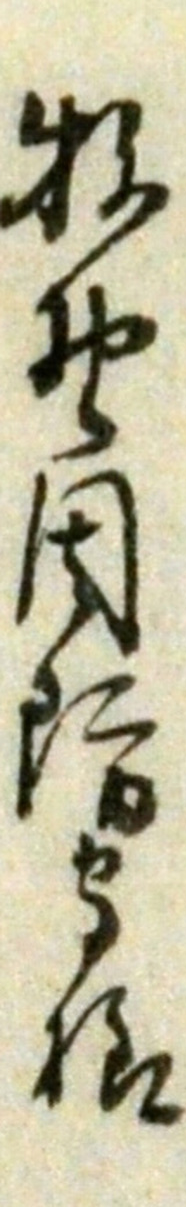牧野周防守様
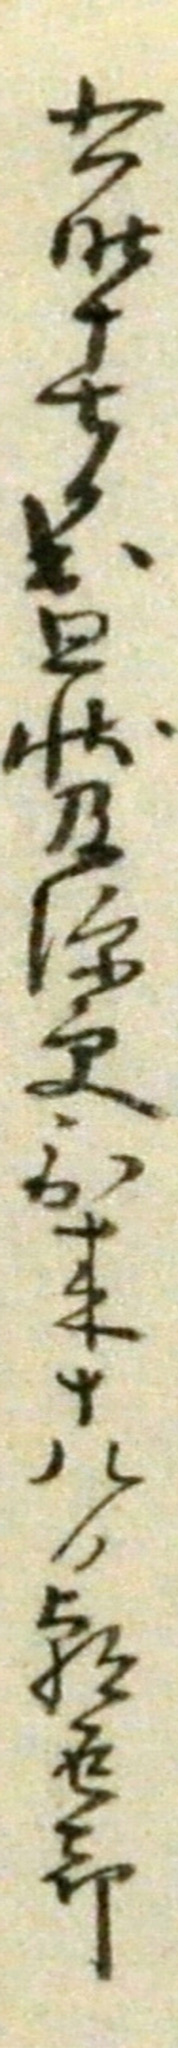右昨十七日出廻状及深更到来十八日朝返却
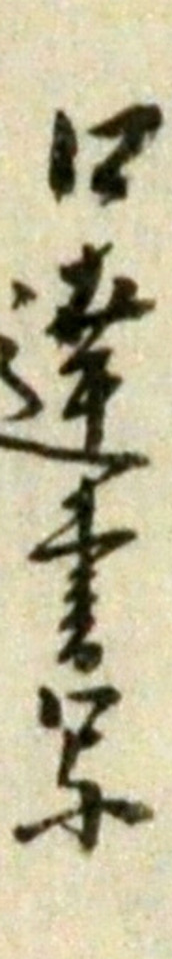口達書写
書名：若君様（家斉嫡男）誕生諸祝儀ノ節ノ留書外
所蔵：伊那市立高遠町図書館・合同会社AMANE
